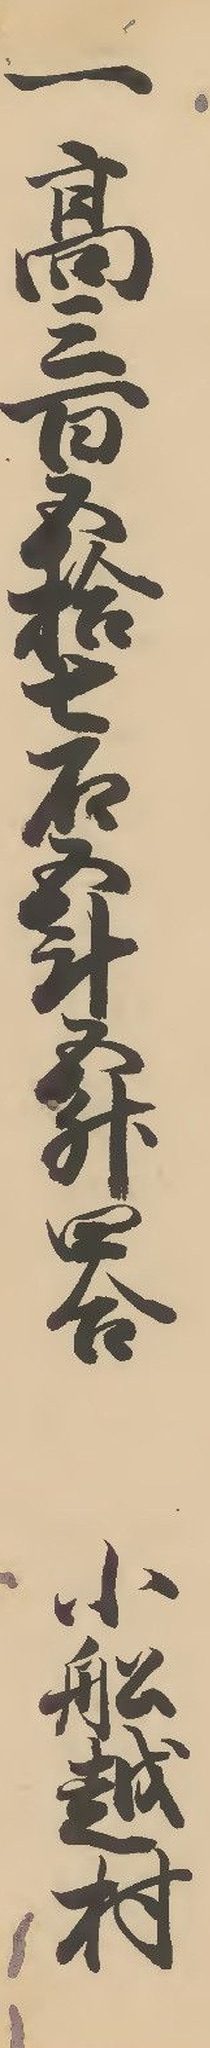一髙三百五拾七石五斗五升四合小舩越村

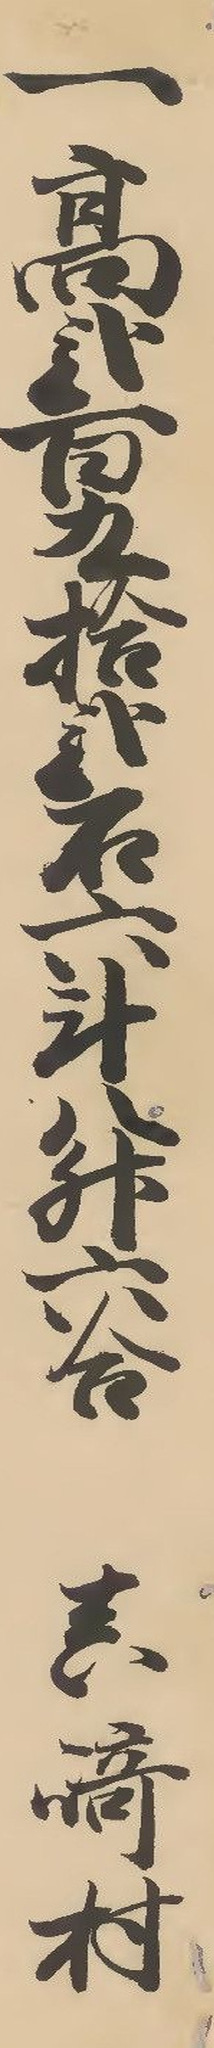一髙弐百九拾弐石六斗八升六合真崎村
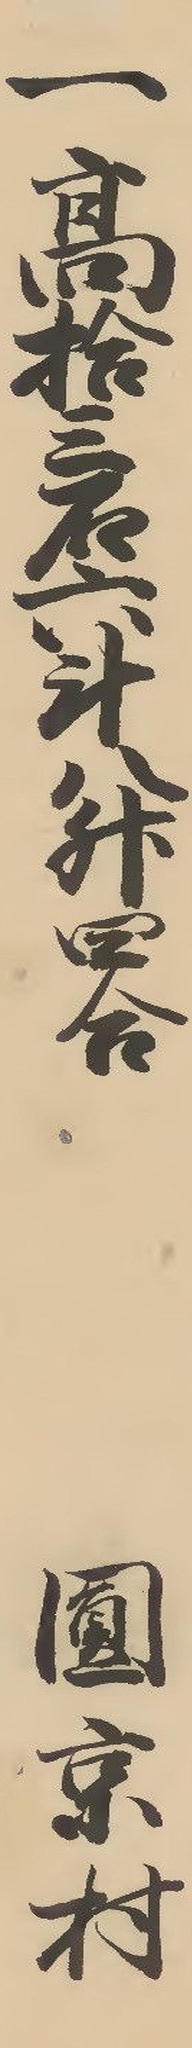一髙拾三石六斗八升四合京村
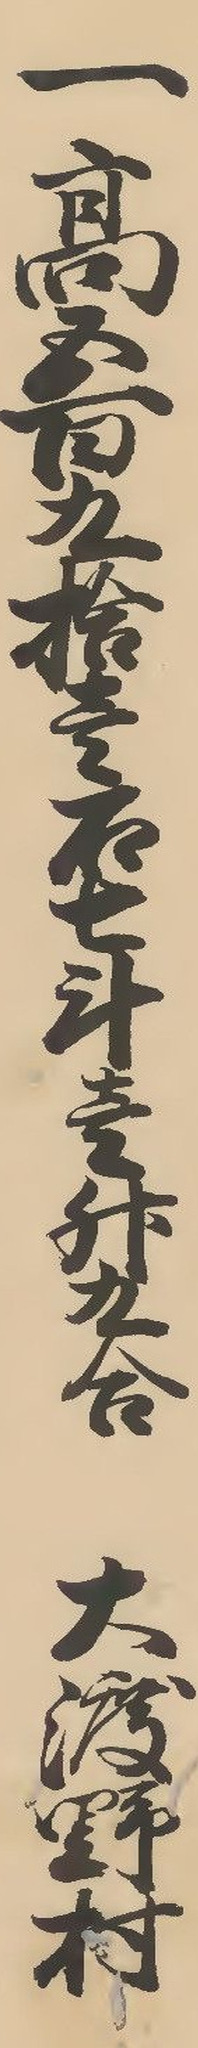一髙五百九拾壱石七斗壱升九合大波野村
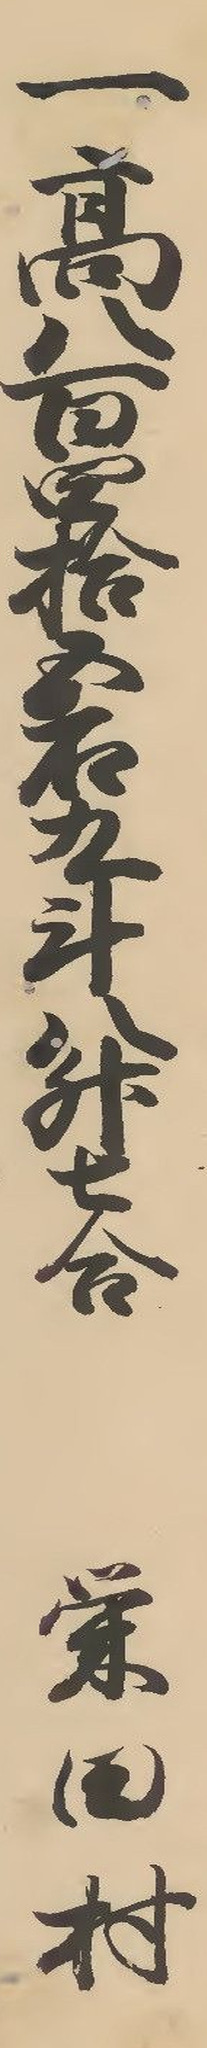一髙八百四拾五石九斗八升七合栄田村
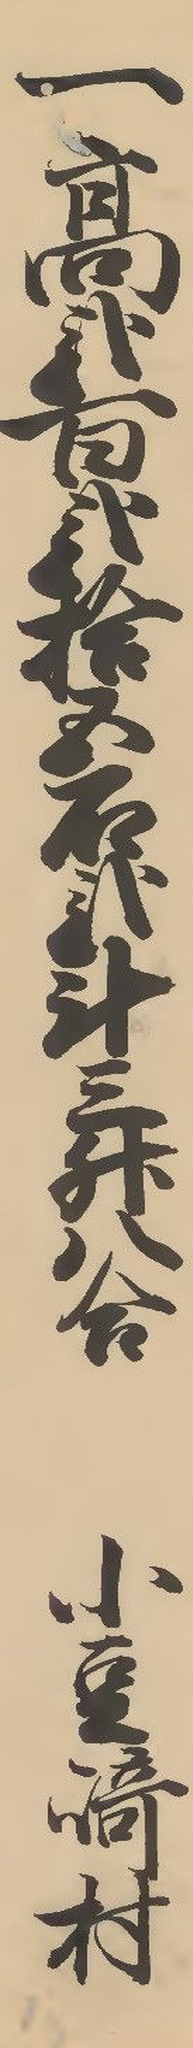一髙弐百弐拾五石弐斗三升八合小豆崎村
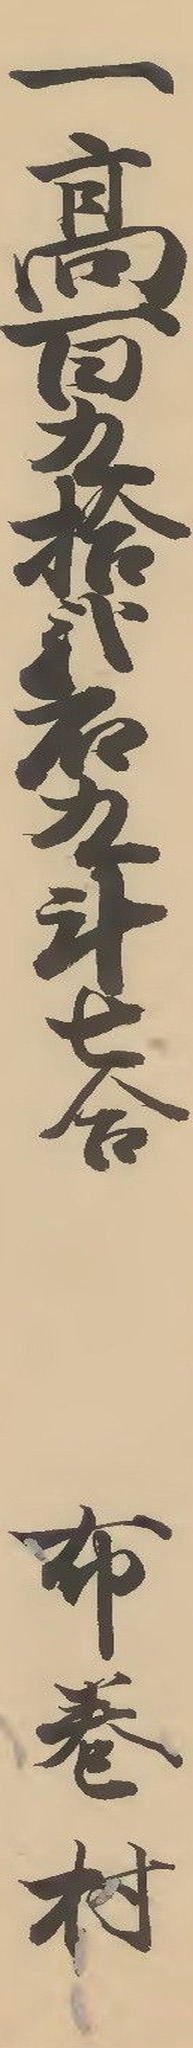一髙百九拾弐石九斗七合布巻村
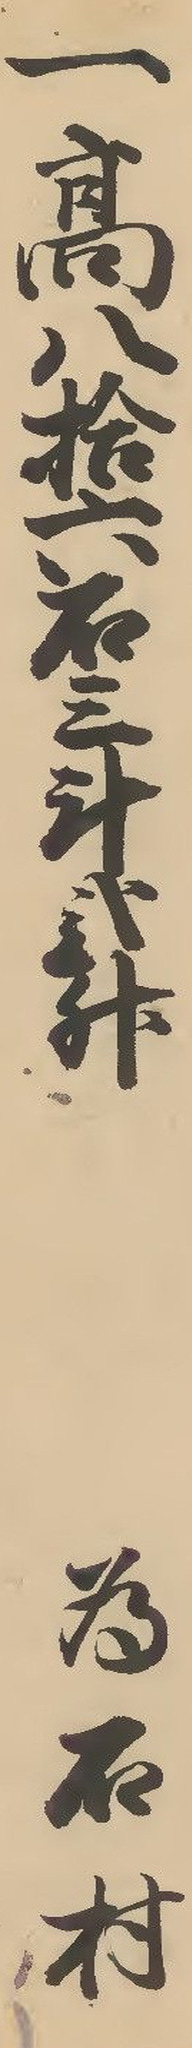一髙八拾六石三斗弐升為石村

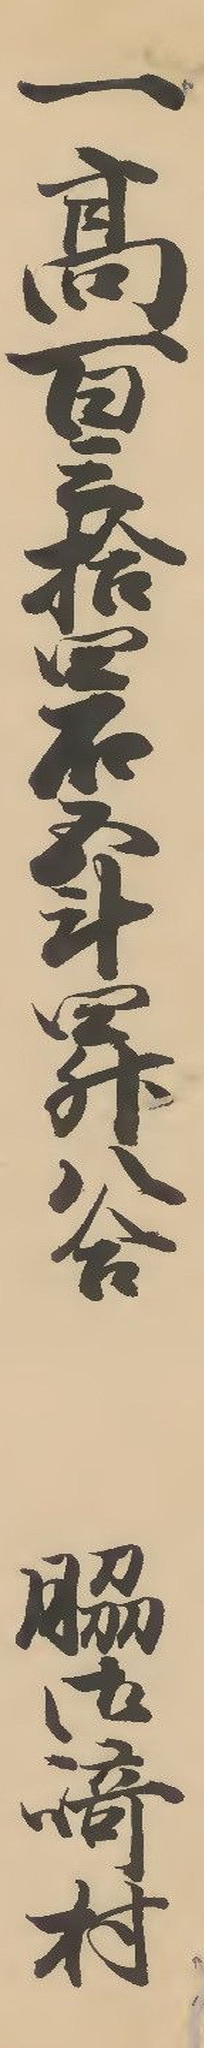一髙百三拾四石五斗四升八合脇御崎村
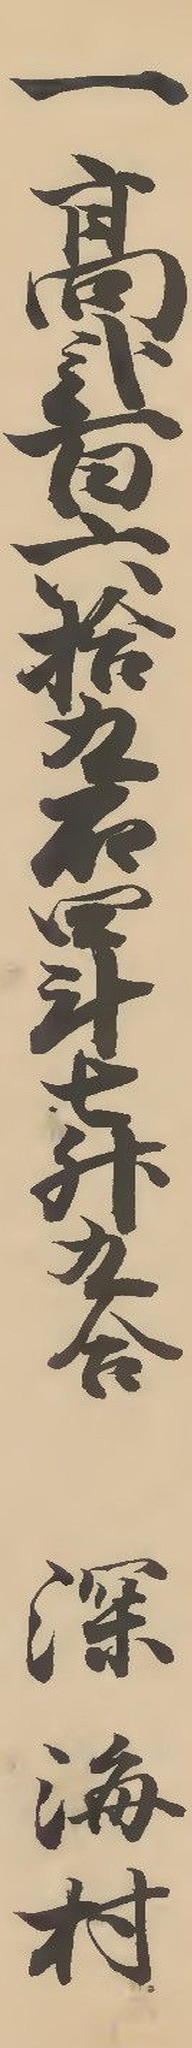一髙弐百六拾九石四斗七升九合深海村
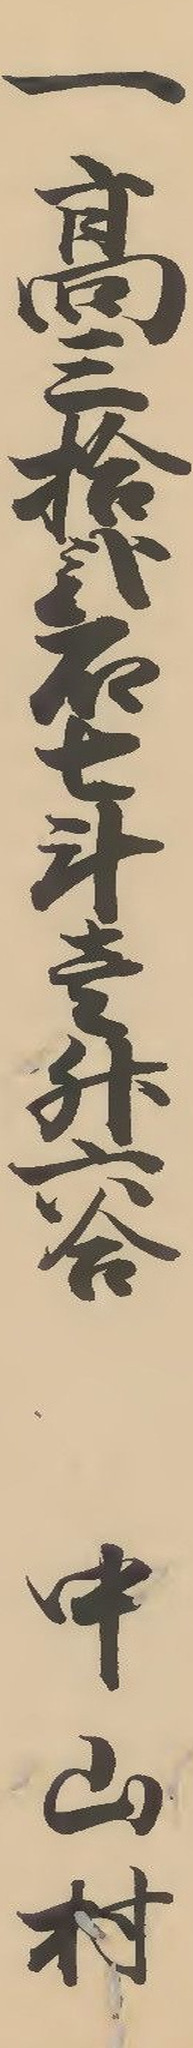一髙三拾弐石七斗壱升六合中山村
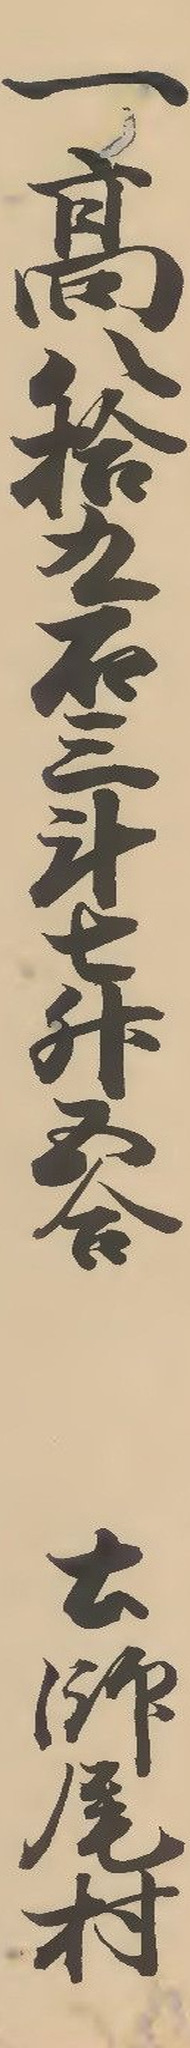一髙八拾九石三斗七升五合土師尾村
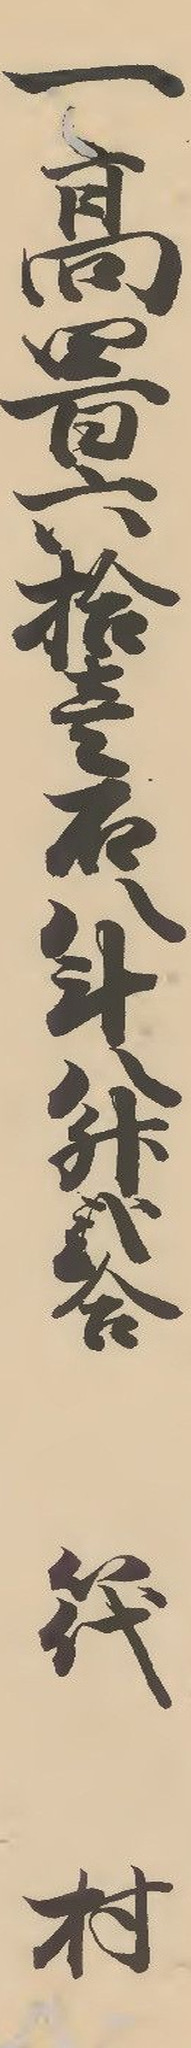一髙四百六拾壱石八斗八升弐合村
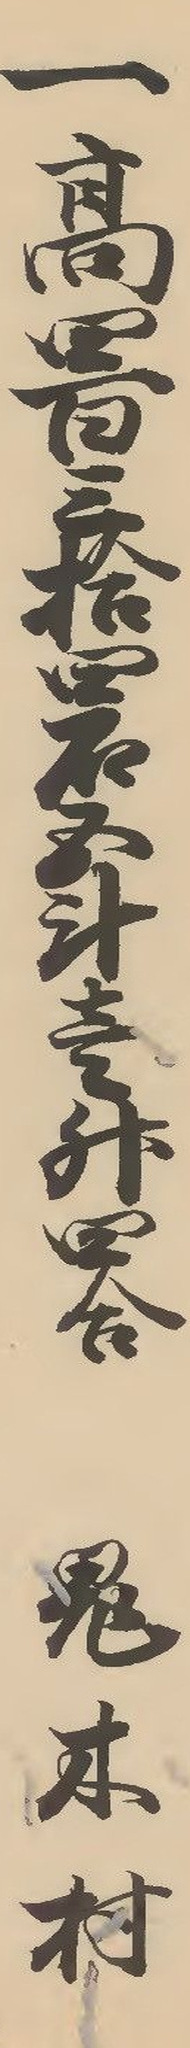一髙四百三拾四石五斗壱升四合鬼木村
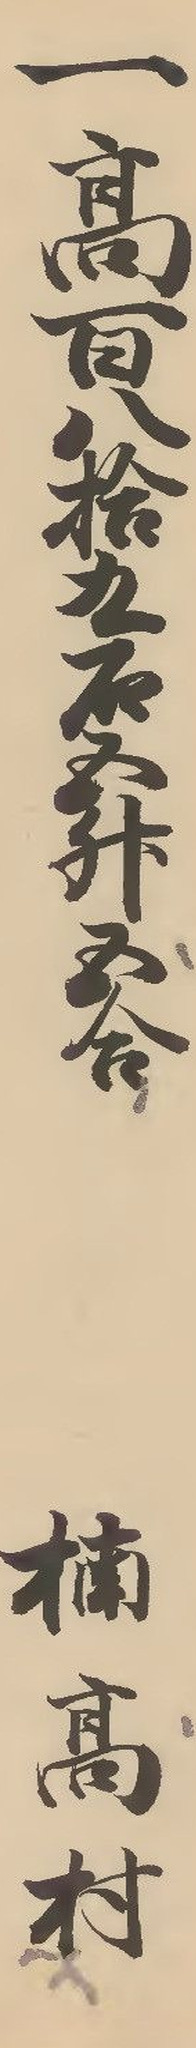一髙百八拾九石五升五合楠髙村
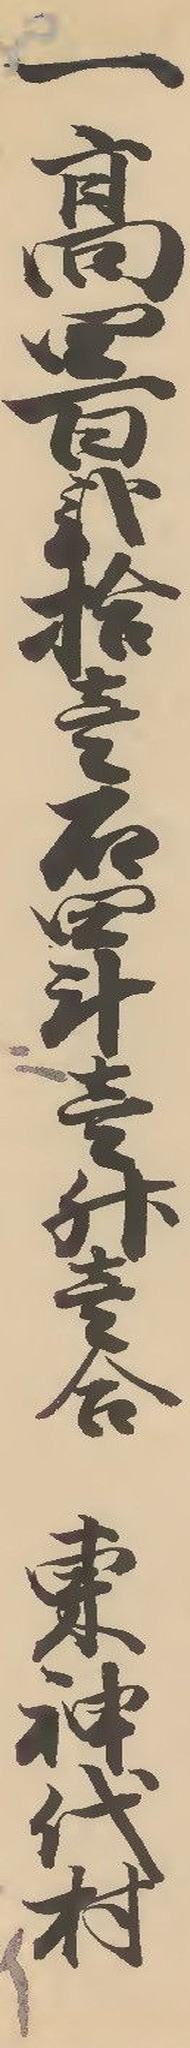一髙四百弐拾壱石四斗壱升壱合東神代村
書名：肥前国郷帳
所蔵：国立公文書館 National Archives of Japan
